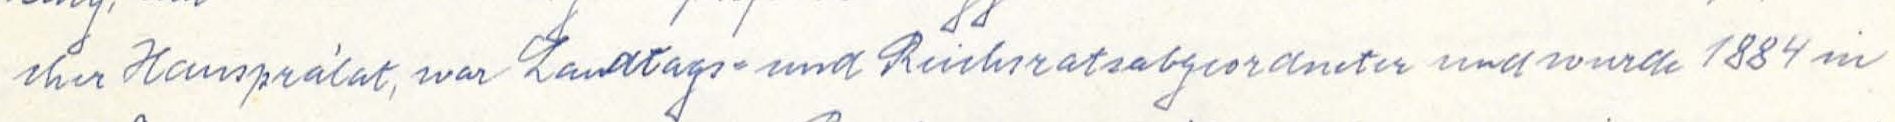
cher Hausprälat, war Landtags- und Reichsratsabgeordneter und wurde 1884 in
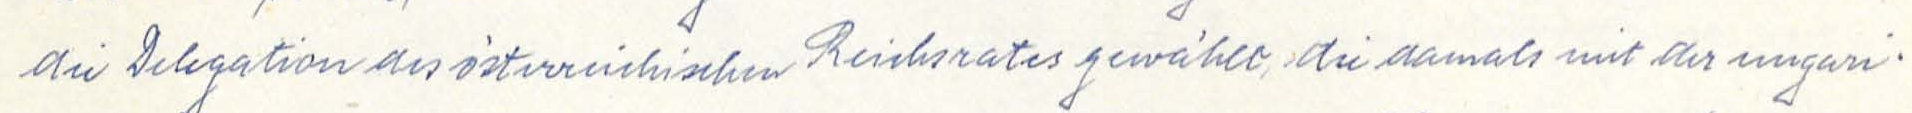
die Delegation des österreichischen Reichsrates gewählt die damals mit der ungari-
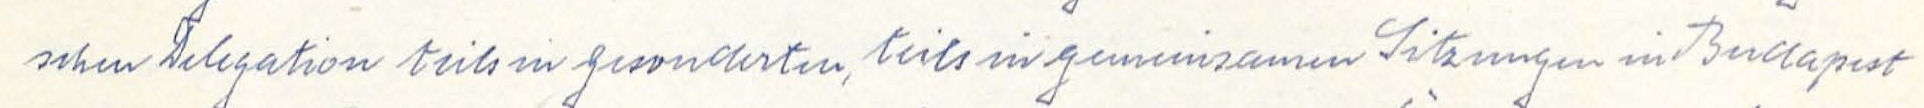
schen Delegation teils in gesonderten, teils in gemeinsamen Sitzungen in Budapest
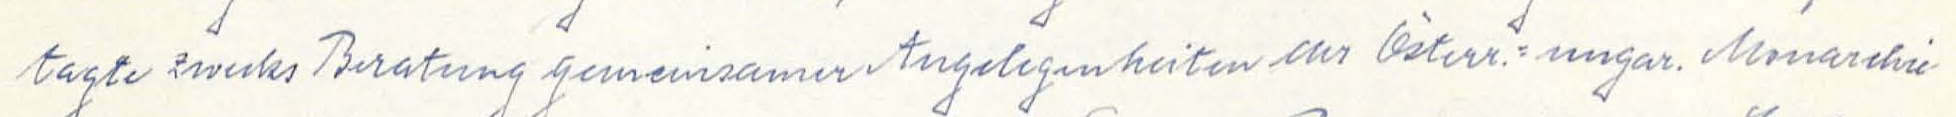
tagte zwecks Beratung gemeinsamer Angelegenheiten der Österr.-Ungar. Monarchie
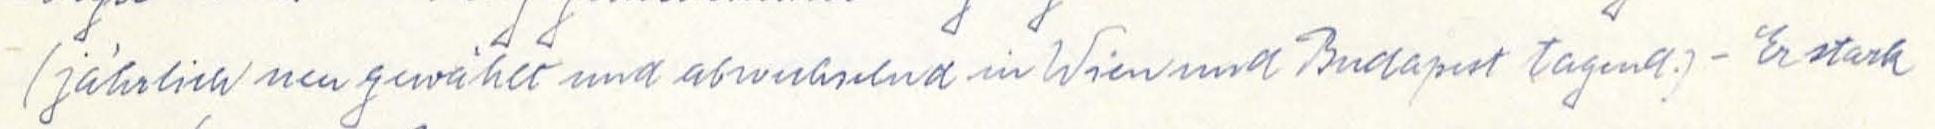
(jährlich neu gewählt und abwechselnd in Wien und Budapest tagend.)- Er starb
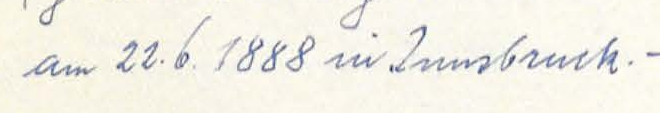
am 22.6.1888 in Innsbruck.-
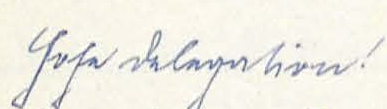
Hohe Delegation
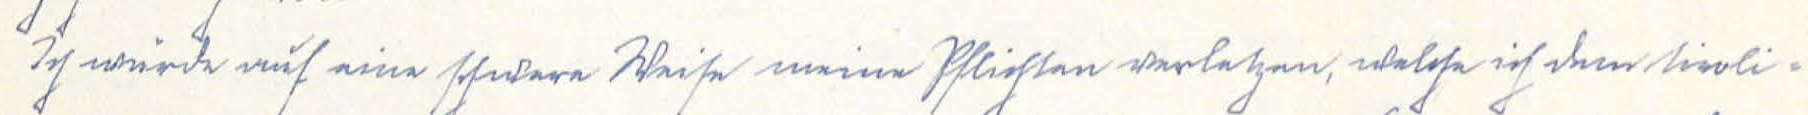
Ich würde auf eine schwere Weise meine Pflichten verletzen, welche ich dem tiroli-
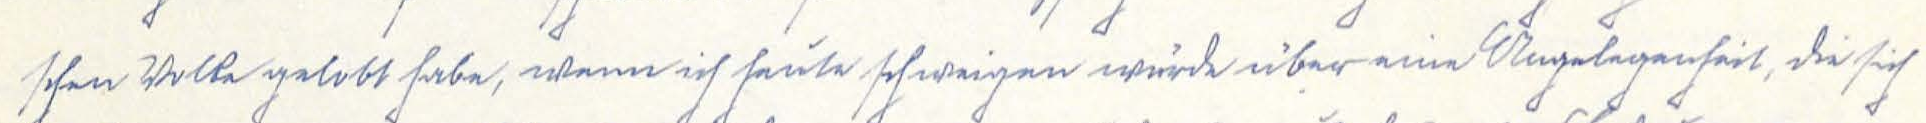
schen Volke gelobt habe, wenn ich heute schweigen würde über eine Angelegenheit, die sich
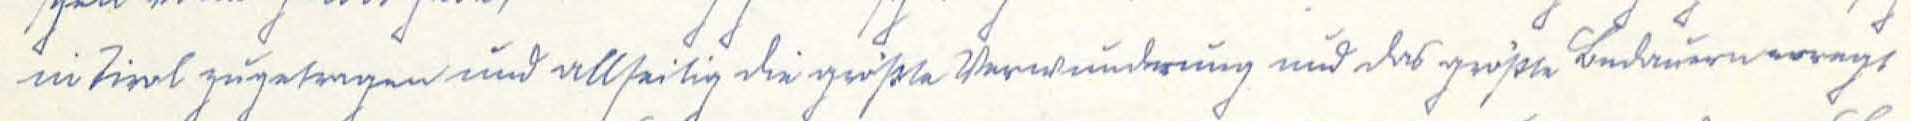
in Tirol zugetragen und allseitig die größte Verwunderung und das größte Bedauern erregt
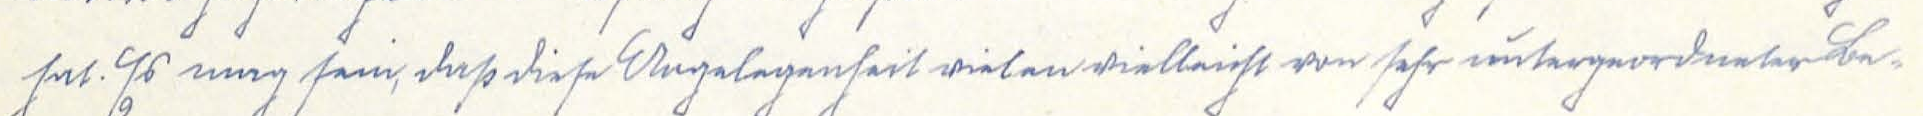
hat. Es mag sein, daß diese Angelegenheit vielen vielleicht von sehr untergeordneter Be-
